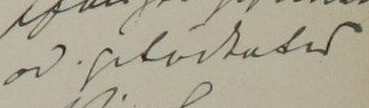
od. getödtetes
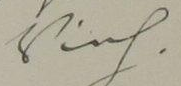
Vieh.
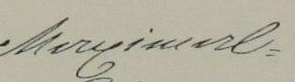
Maximal-
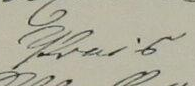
Preis
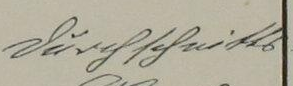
Durchschnitts-
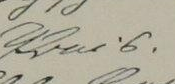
Preis
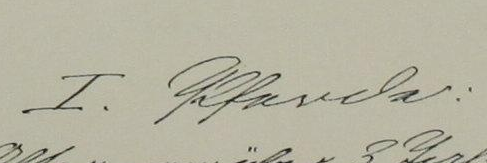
I. Pferde:
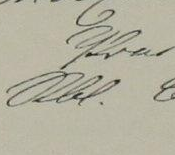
Rbl.
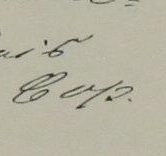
Cop.
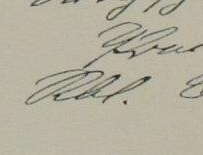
Rbl.
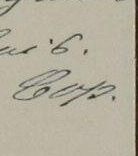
Cop
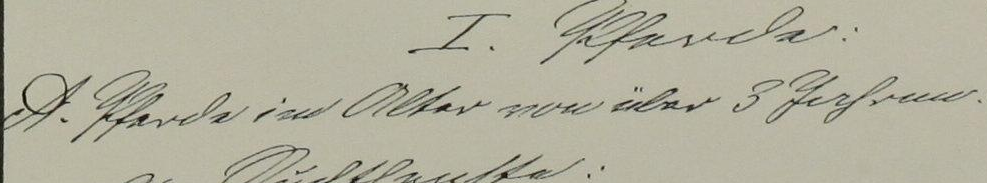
A. Pferde im Alter von über 3 Jahren:
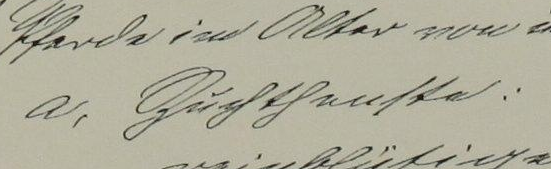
a. Zuchthengste:
